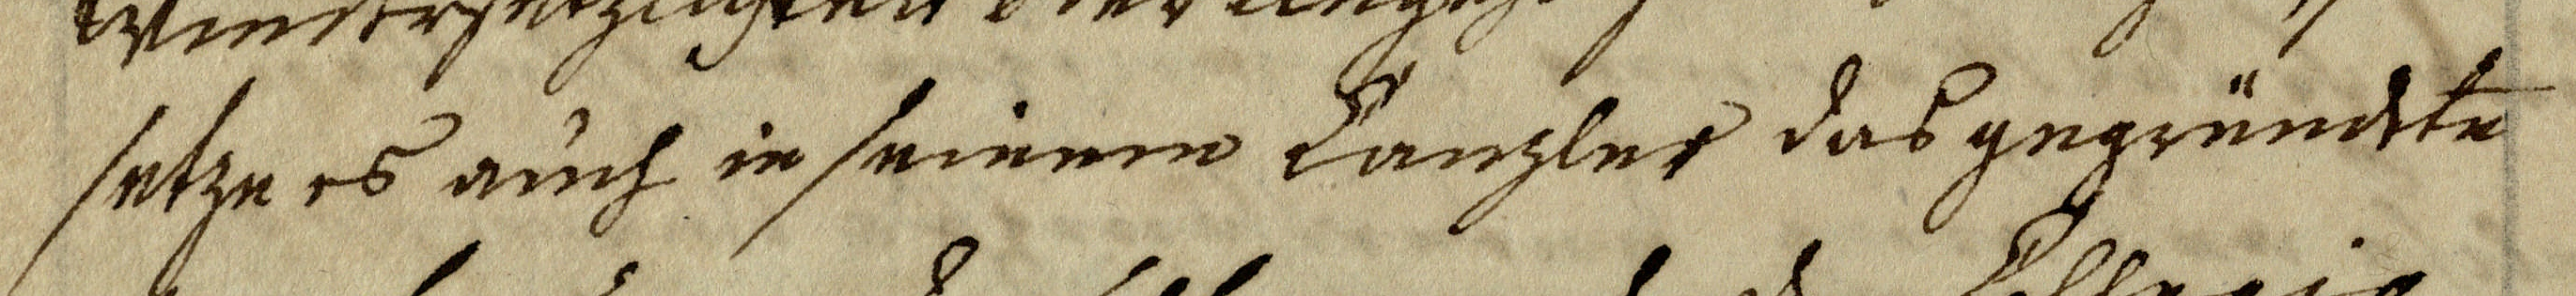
setze es auch in seinem Canzler das gegründete
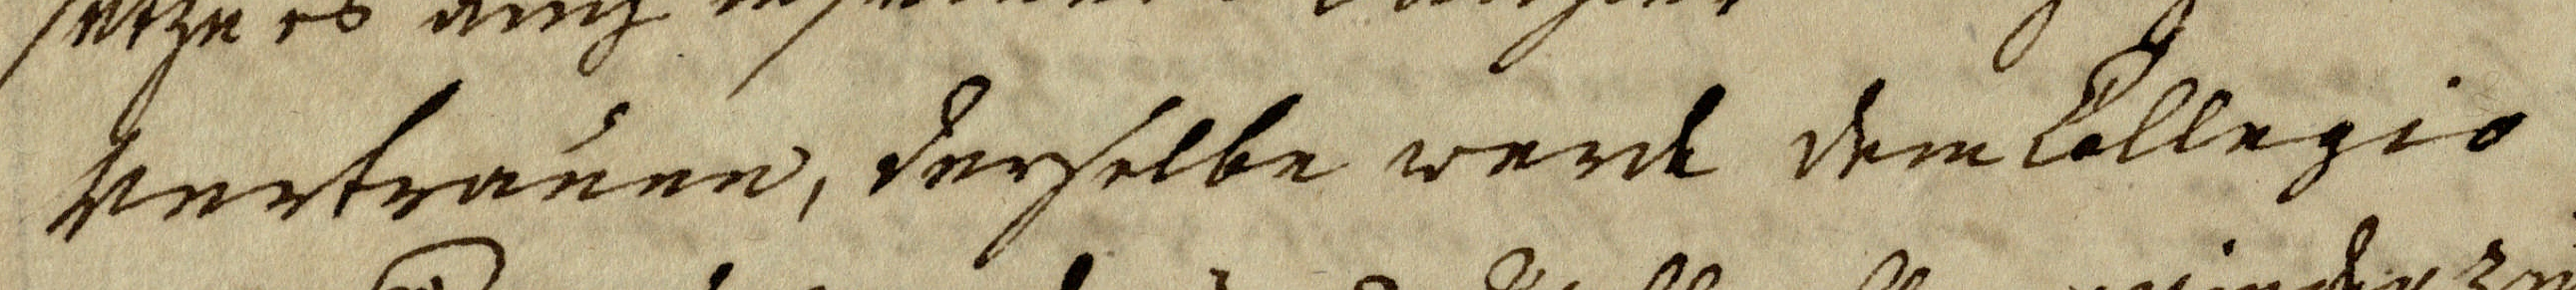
Vertrauen, derselbe werde dem Collegio
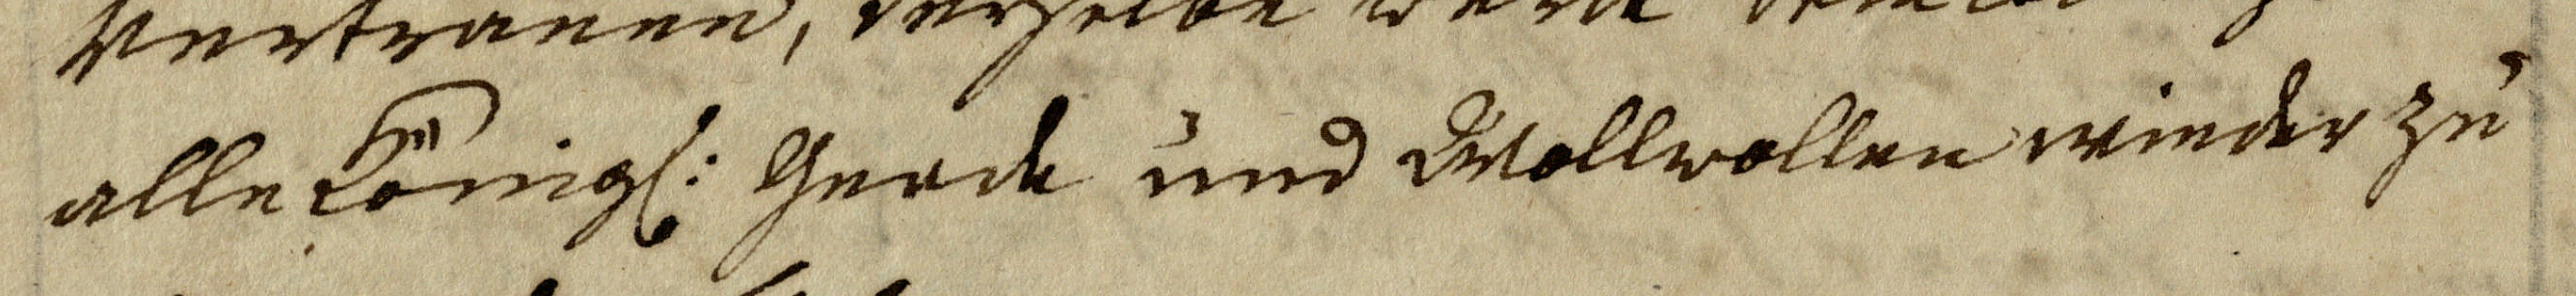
alle Königl. Gnade und Wollwollen wieder zu
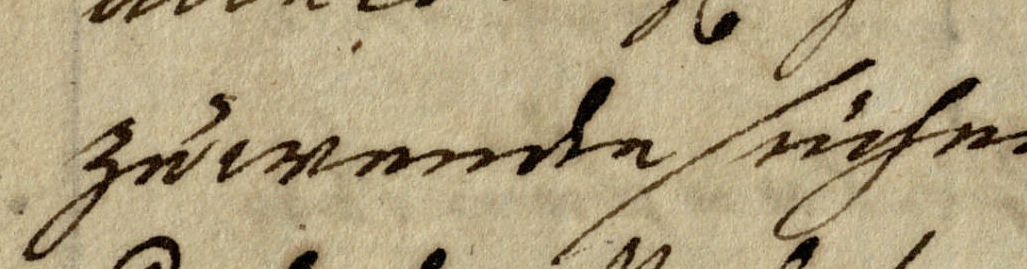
zuwenden suchen.
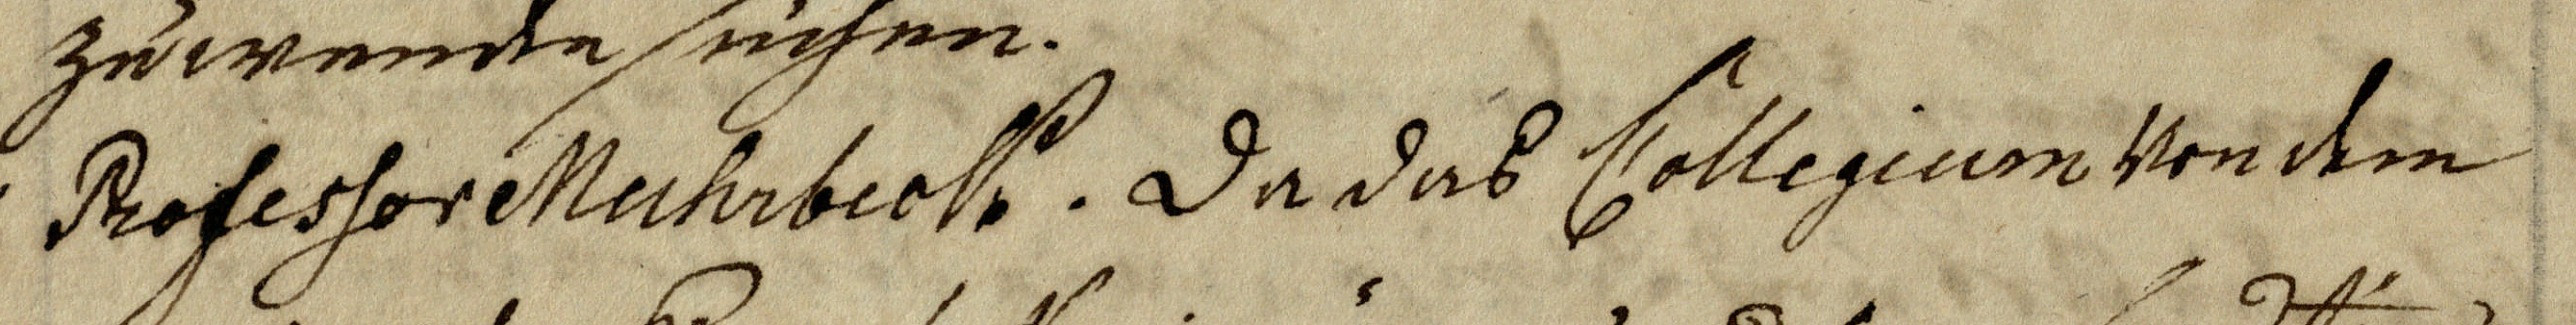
dh Professor Muhrbeck. Da das Collegium von dem
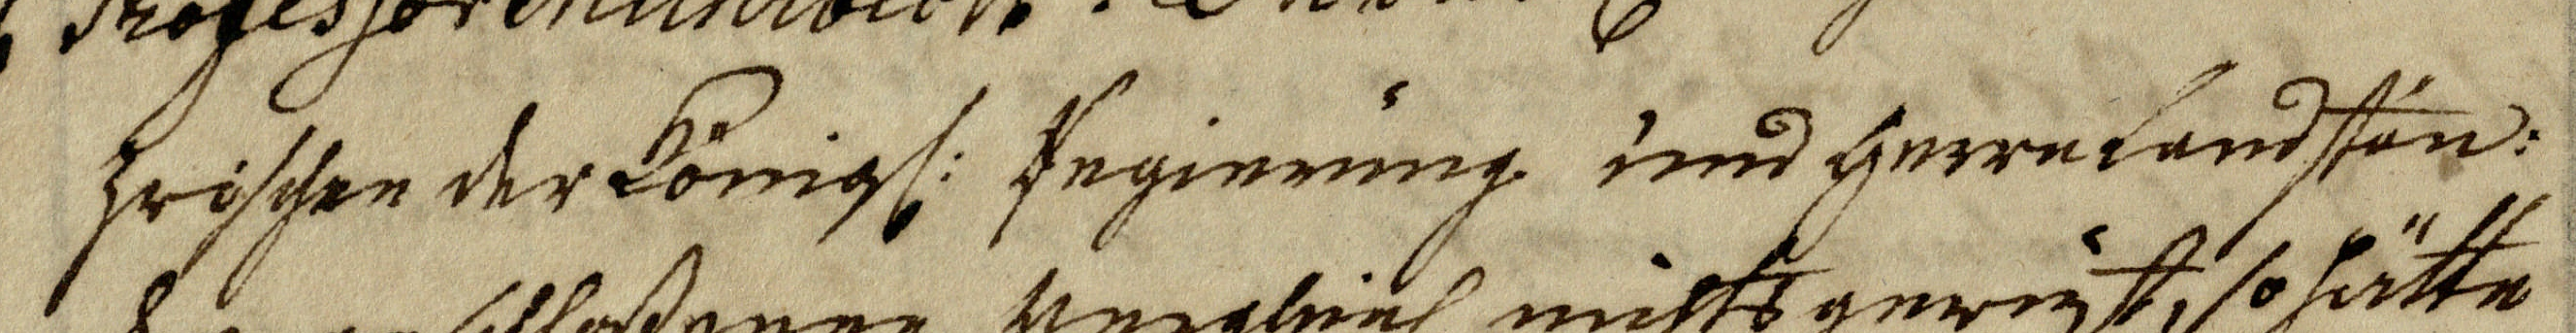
zwischen der Königl. Regierung und Herrn Landstän¬
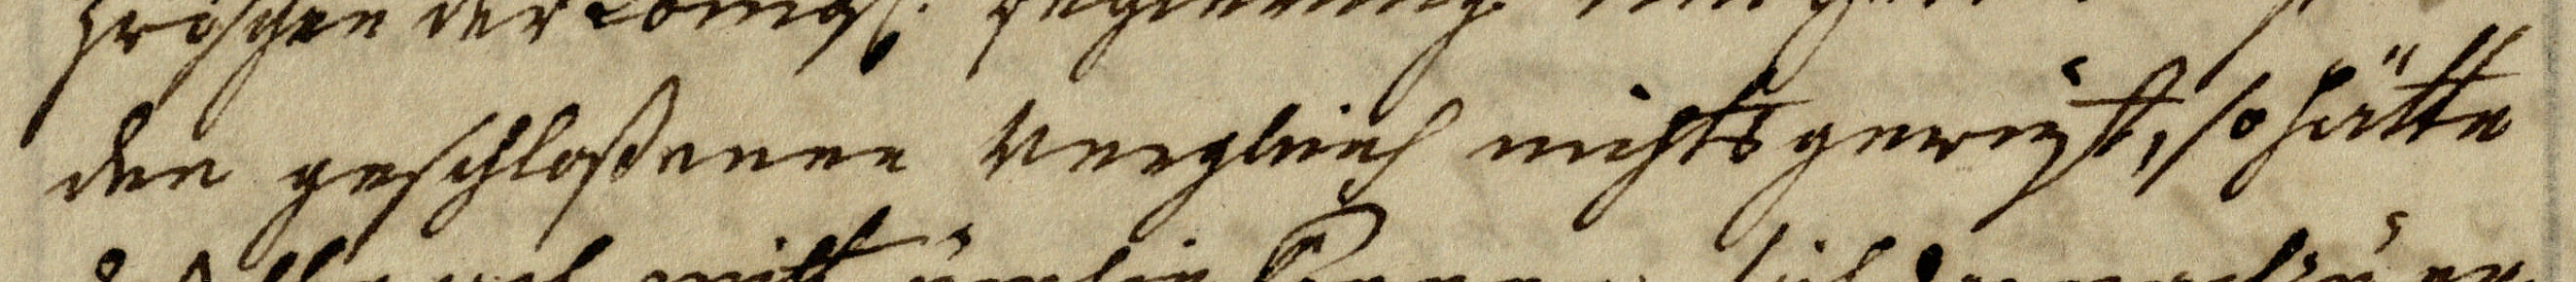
den geschloßenen Vergleich nichts gewust, so hätte
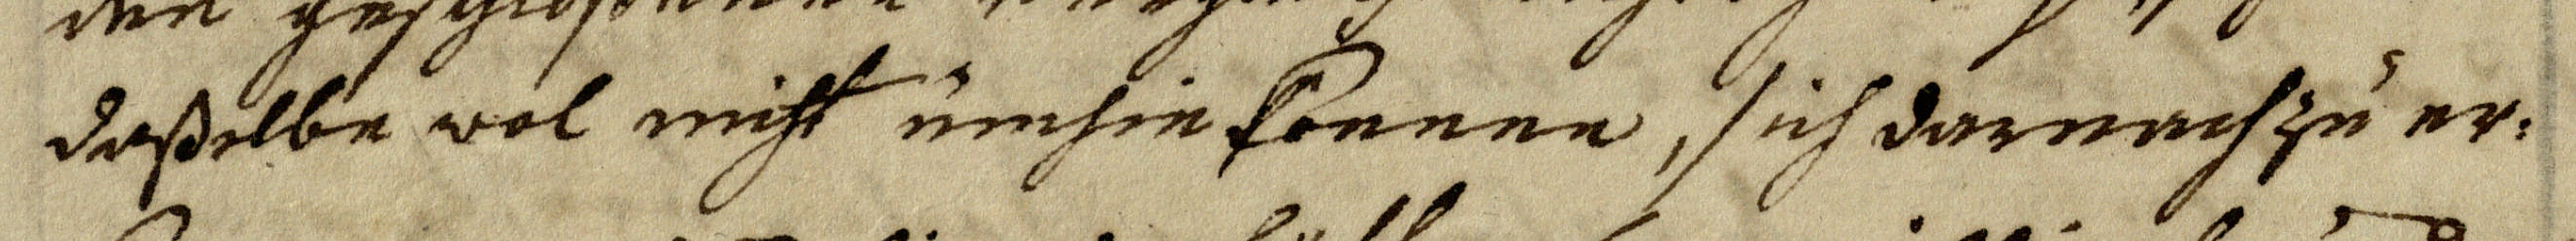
daßelbe wol nicht umhin können, sich darnach zu er¬
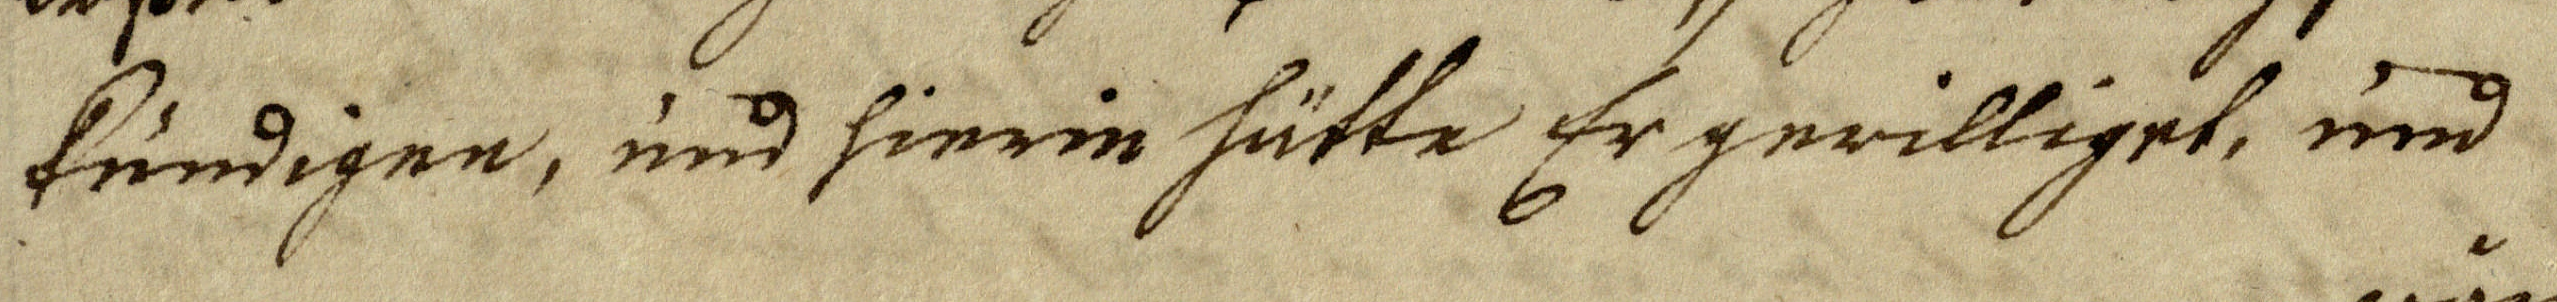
kundigen, und hierin hätte Er gewilliget, und
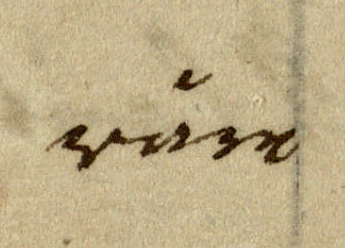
wäre
